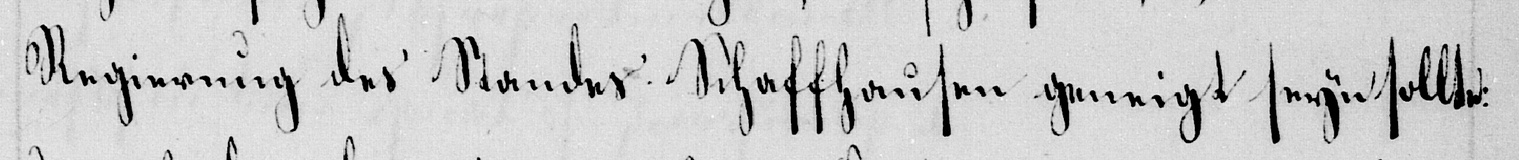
Regierung des Standes Schaffhausen geneigt seyn sollte:
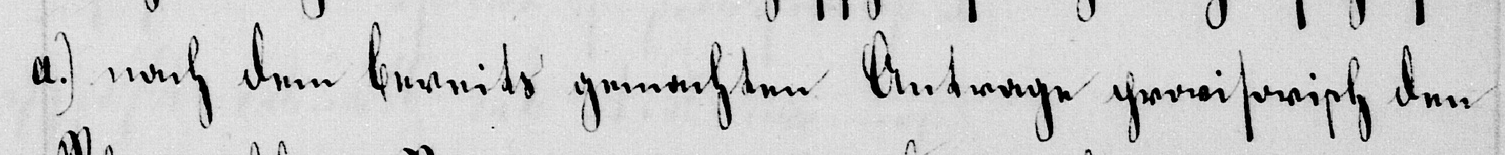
a.) nach dem bereits gemachten Antrage provisorisch den
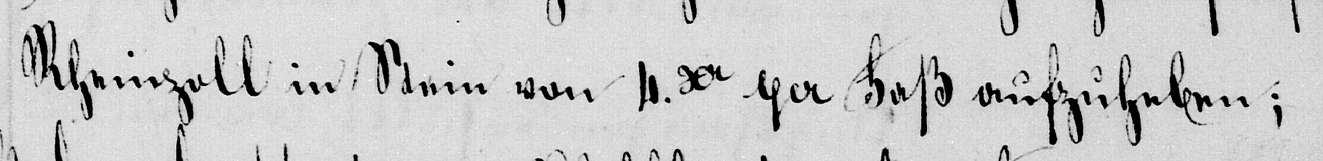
Rheinzoll in Stein von 4.Xr per Faß aufzuheben;
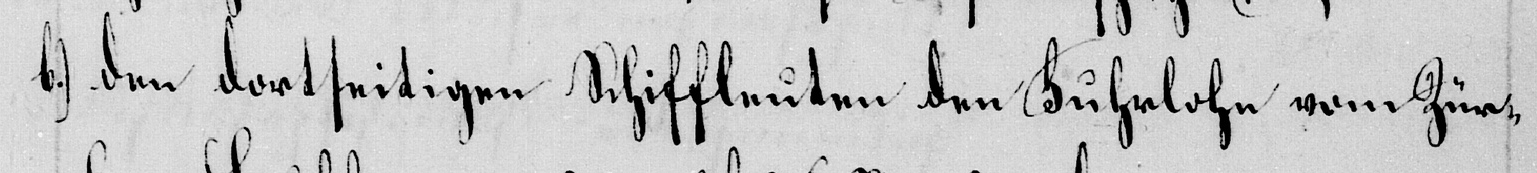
b.) den dortseitigen Schiffleuten den Fuhrlohn vom Zür¬
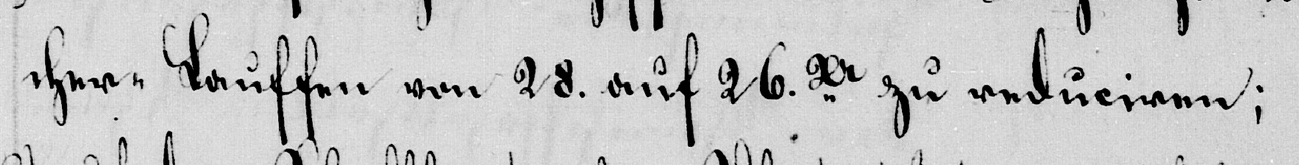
cher Lauffen von 28. auf 26.Xr zu reduciren:
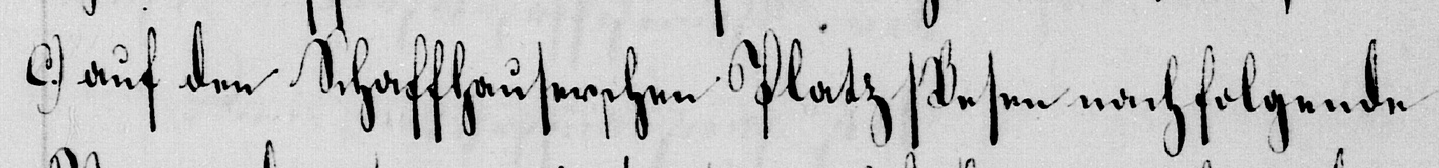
c.) auf den Schauffhauserschen Platzspesen nachfolgende
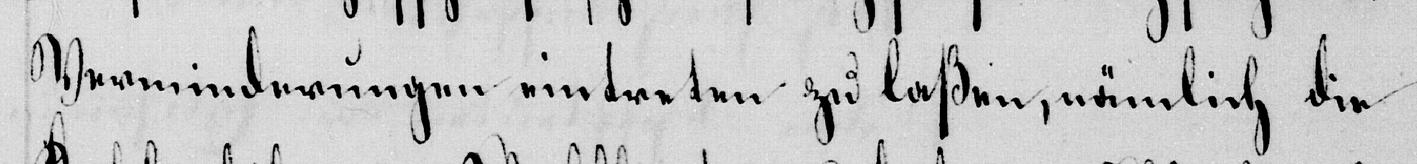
Verminderungen eintreten zu laßen, nämlich die
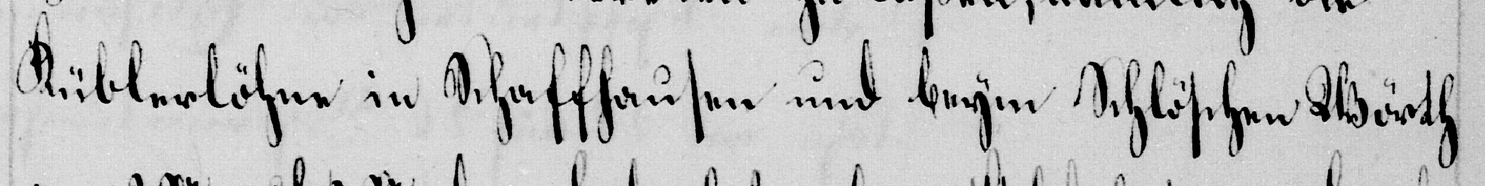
Küblerlöhne in Schaffhausen und beym Schlöschen Wörth
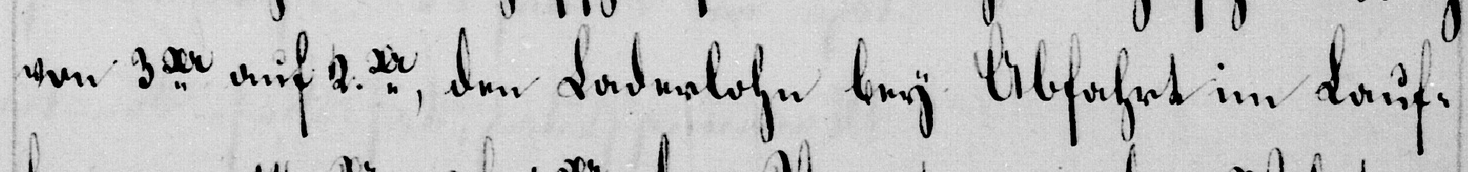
von 3.Xr auf 2.Xr, den Laderlohn bey Abfahrt in Lauf¬
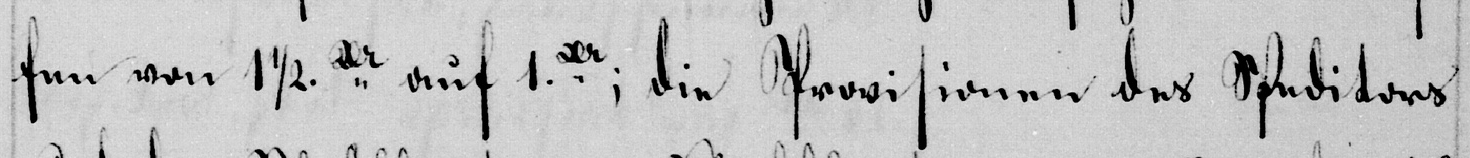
fen von 1 ½.Xr auf 1. Xr; die Provisionen des Speditors
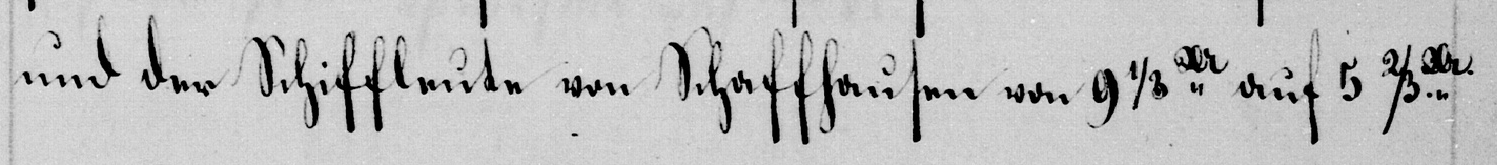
und der Schiffleute von Schaffhausen von 9 1/3.Xr auf 5 3/3.Xr.
